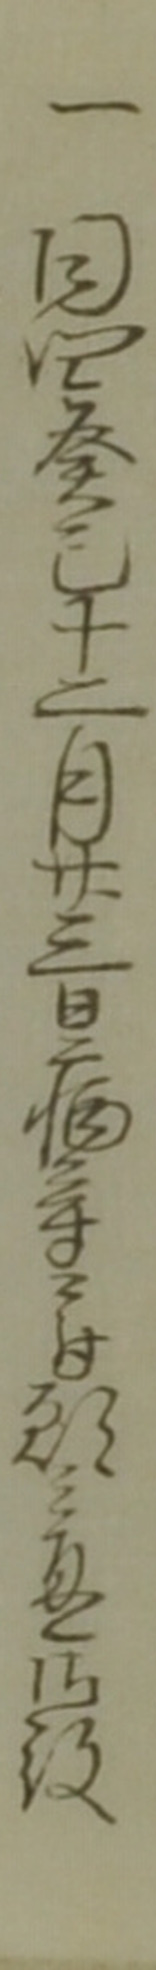一同四癸巳十二月廿三日病気ニ付願之通御役
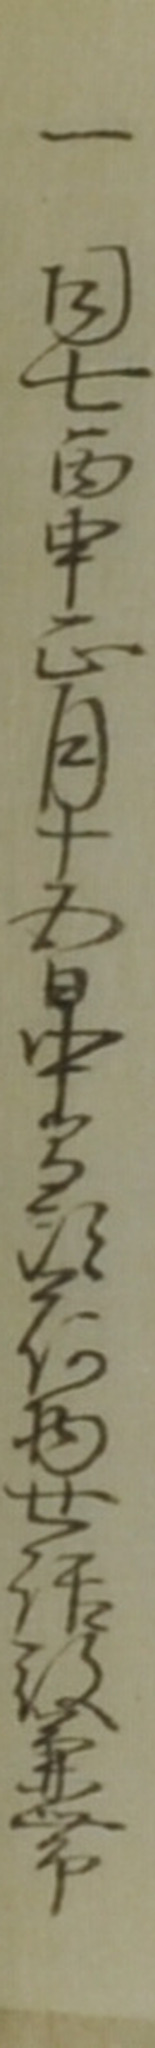一同七丙申正月十五日中間頭荷物世話役兼帯
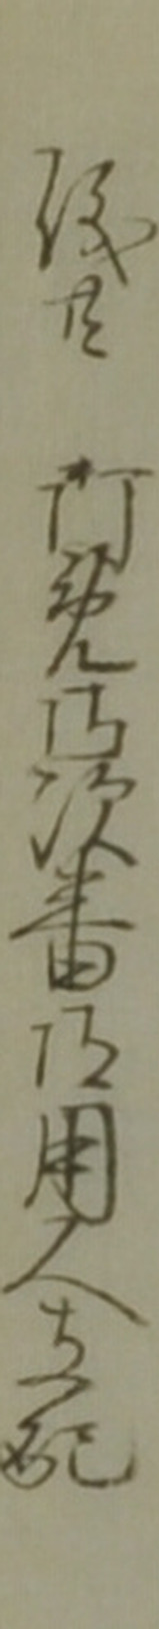儀共御免御次番御用人支配
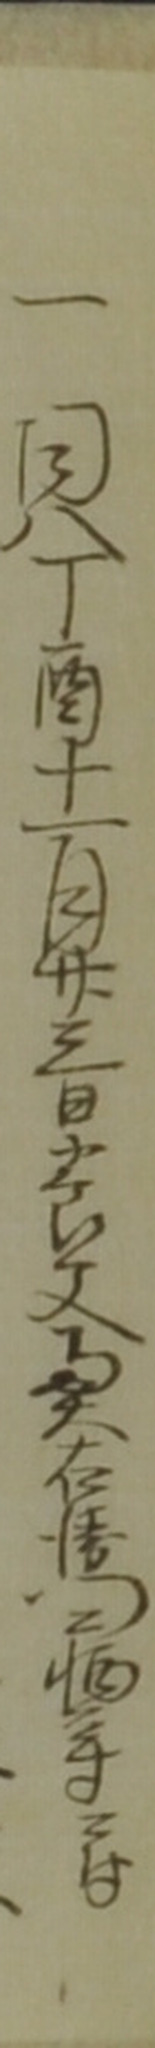一同八丁酉十一月廿三日養父奥右衛門病気ニ付
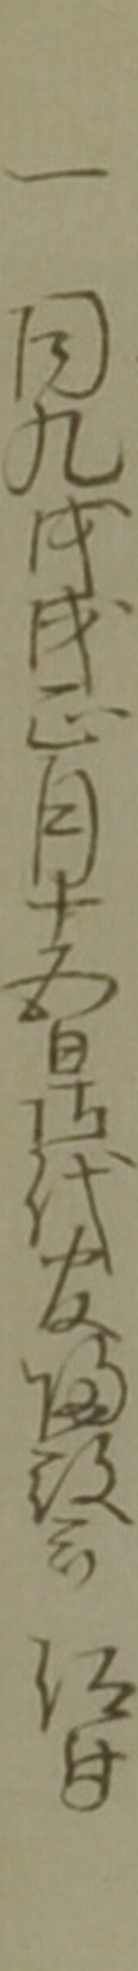一同九戊戌正月十五日御代官帰役被仰付
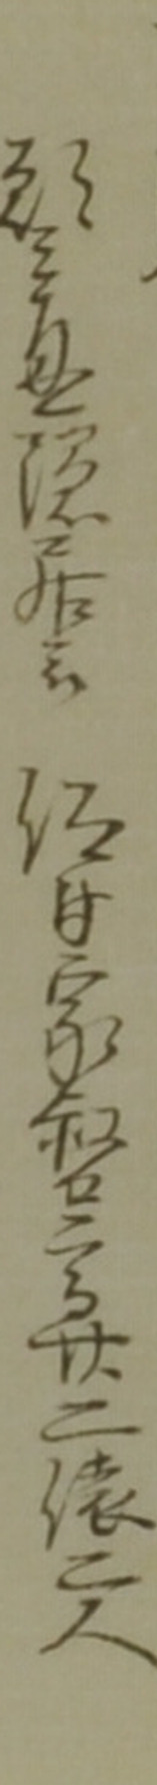願之通隠居被仰付家督高廿二俵二人
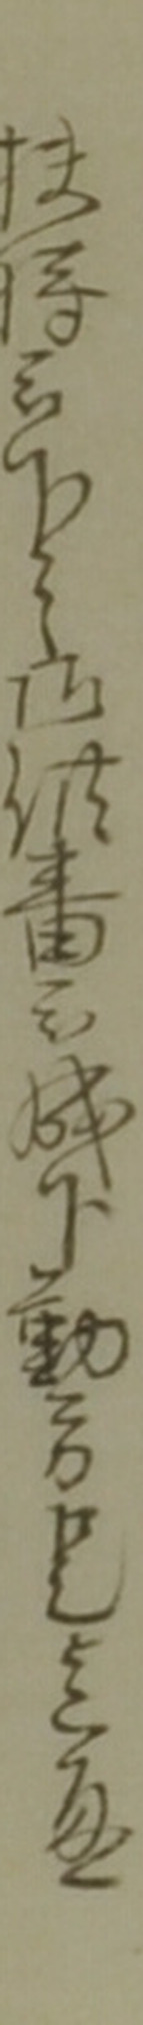扶持被下之御供番被成下勤方是迄通
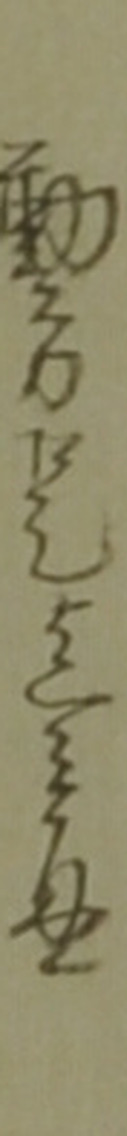勤方是迄之通

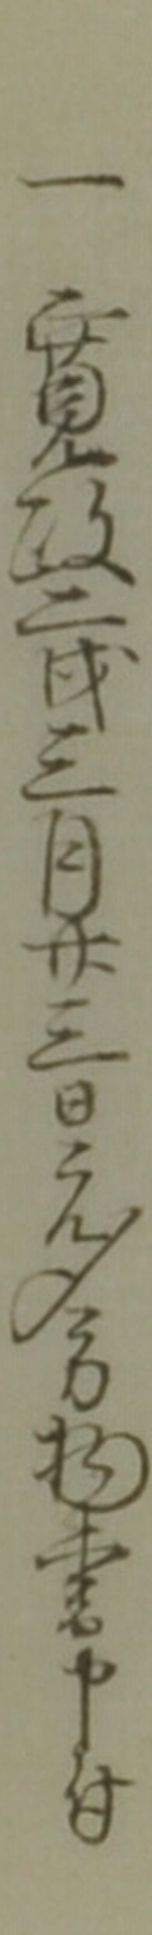一寛政二戌三月廿三日元〆方物書申付
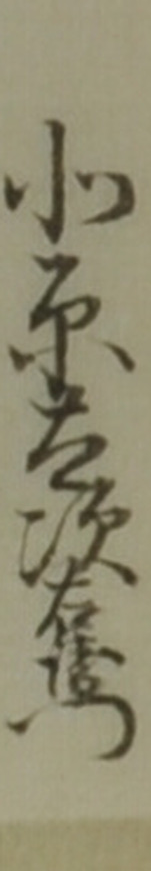北原太次右衛門
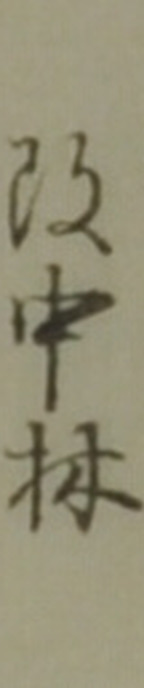改中林
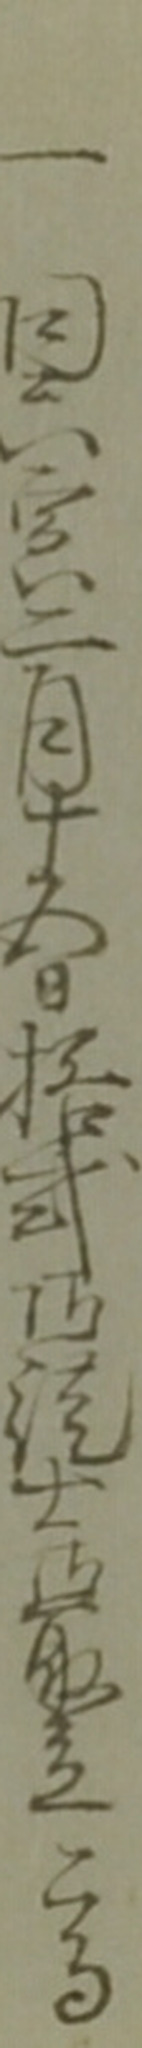一同六寅二月十五日格式御徒士御取立高
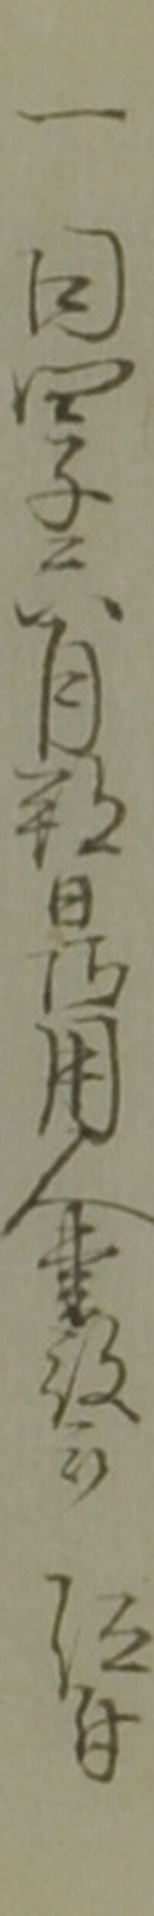一同四子六月朔日御用人書役被仰付
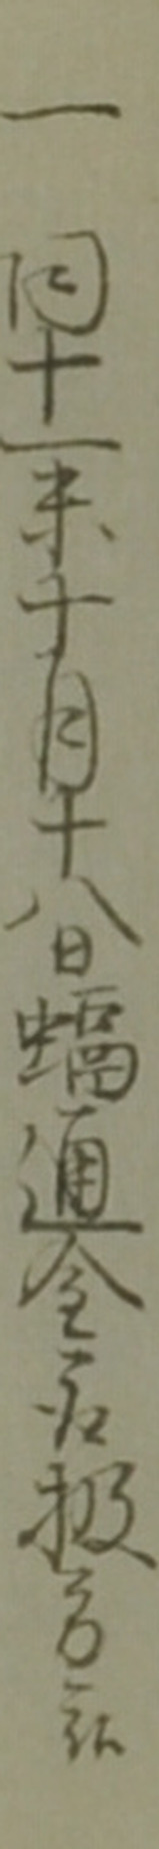一同十一未十月十八日蝠通金取扱方被
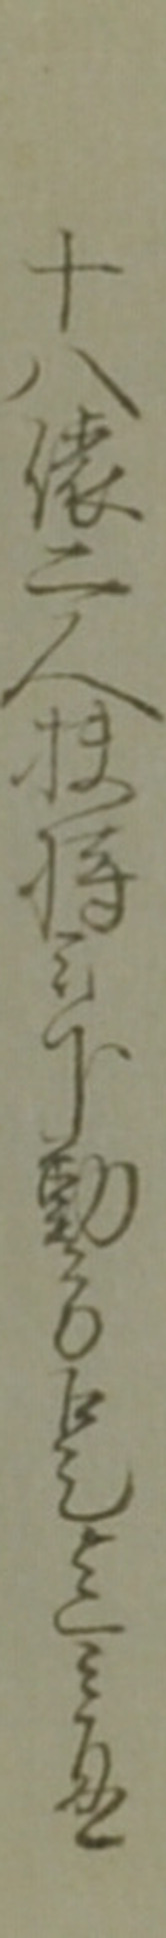十八俵二人扶持被下勤方是迄之通
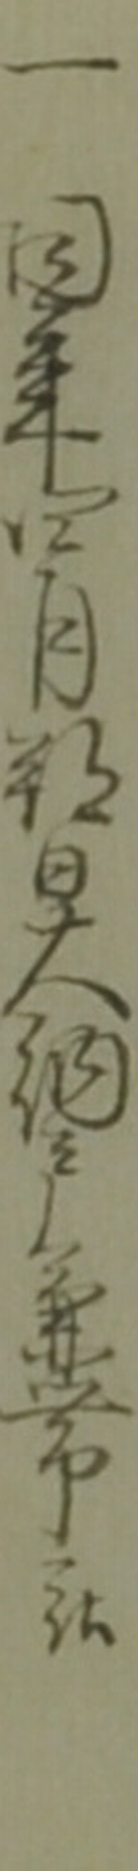一同年四月朔日大納戸兼帯被
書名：無足諸士勤仕録（三）
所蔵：伊那市立高遠町図書館・合同会社AMANE
